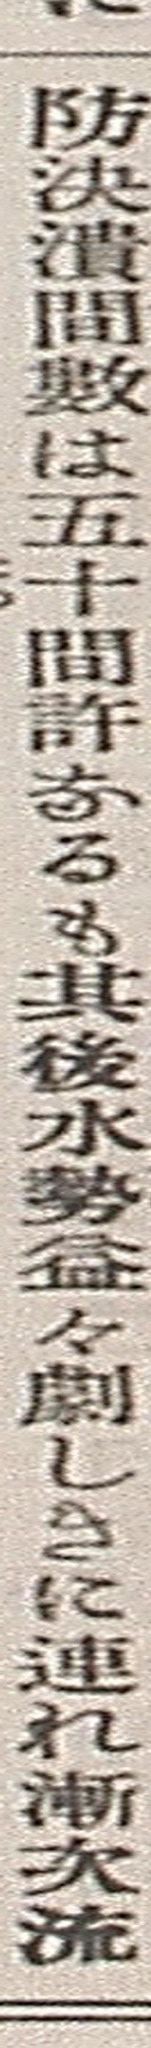防決潰間数は五十間許なるも其後水勢益々劇しきに連れ漸次流
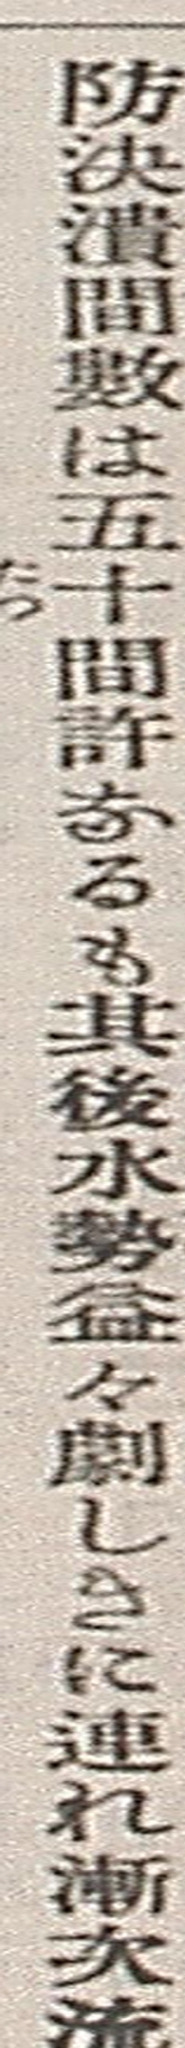防決潰間数は五十間許なるも其後水勢益々劇しきに連れ漸次流
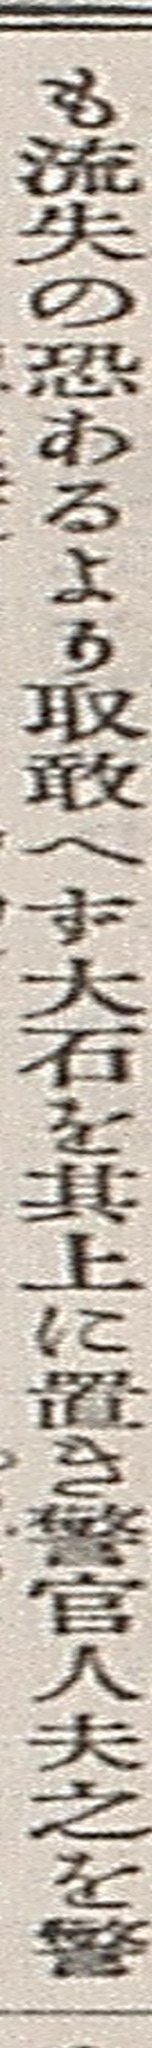しつ）の恐あるより取敢へず大石を其上に置き警官人夫之を警
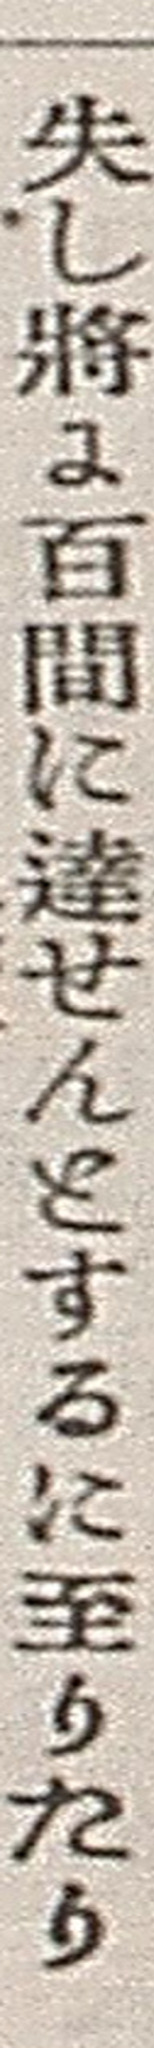失し雅に百間に達せんとするに至りたり
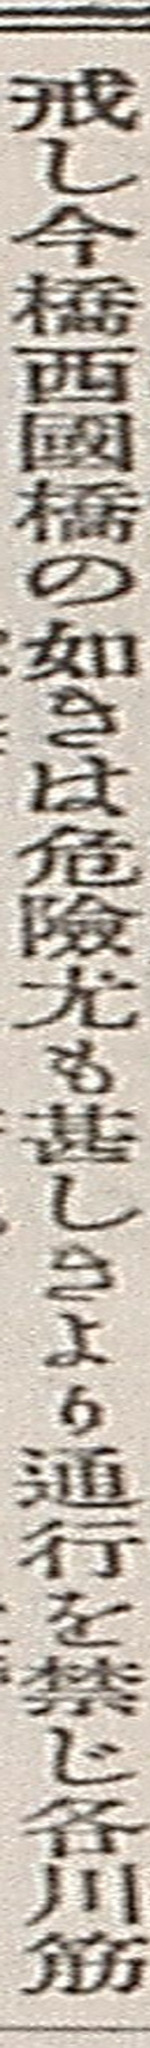さいこくばし）の如きは危険尤も甚しきより通行を禁じ各川筋
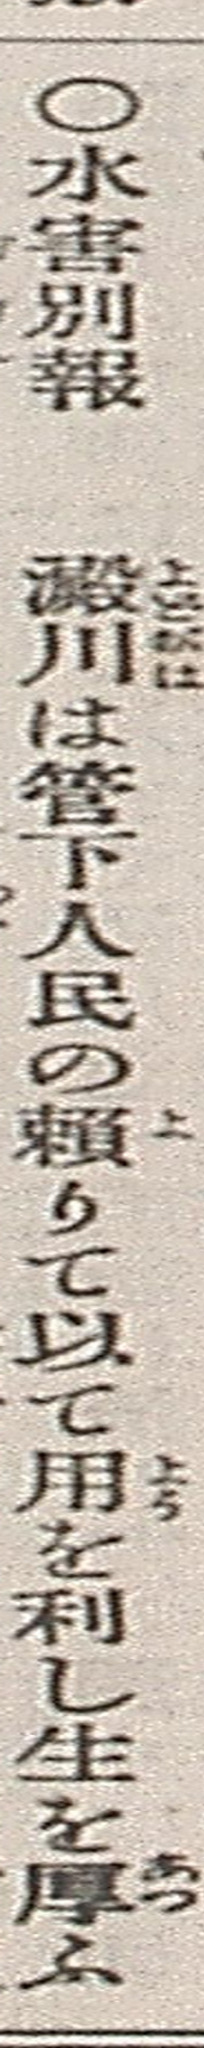◯水害別報淀川は管下人民の頼りて以て用を利し生を厚ふ
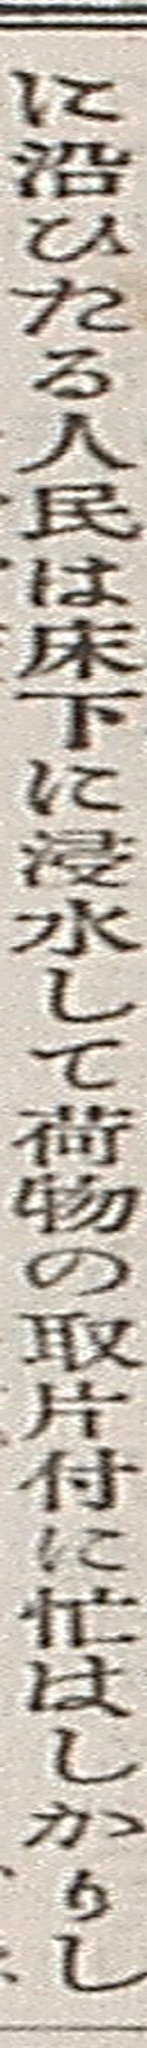に沿ひたる人民は床下に浸水して荷物の取片付に忙はしかりし
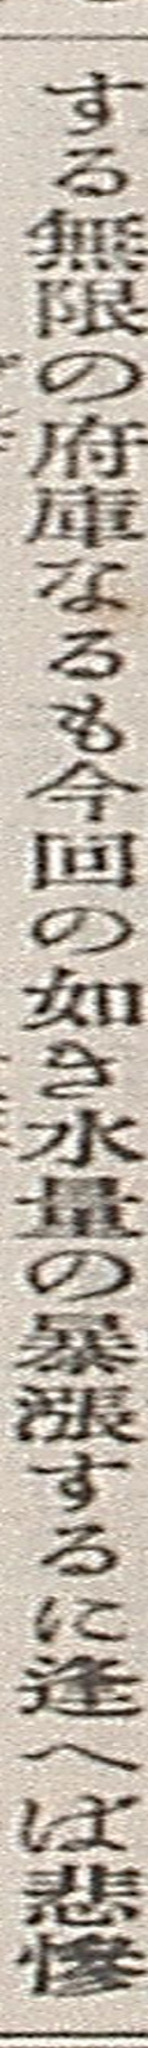する無限の府庫なるも今回の如き水量の暴漲するに逢へば悲惨
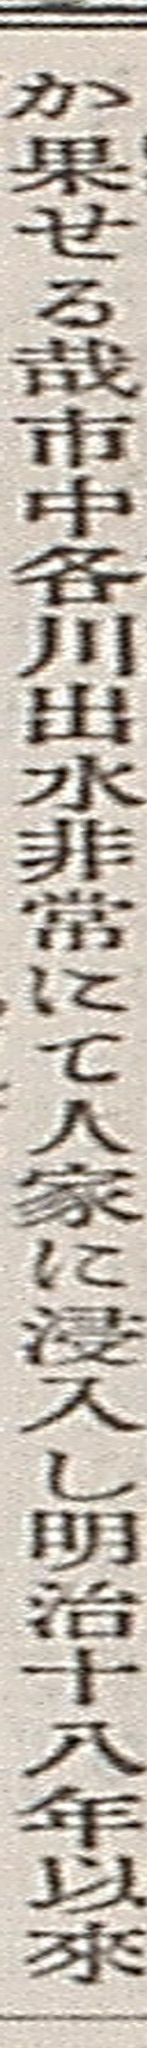か果せる哉市中各川出水非常にて人家に侵入し明治十八年以来
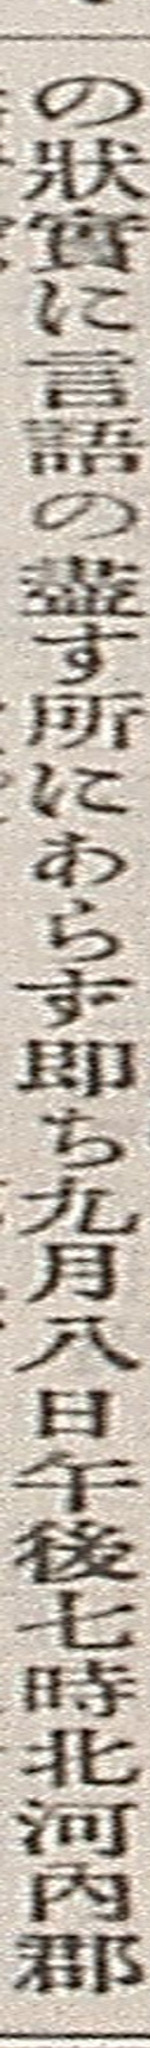の状実に言語の尽す所にあらず即ち九月八日午後七時北河内郡
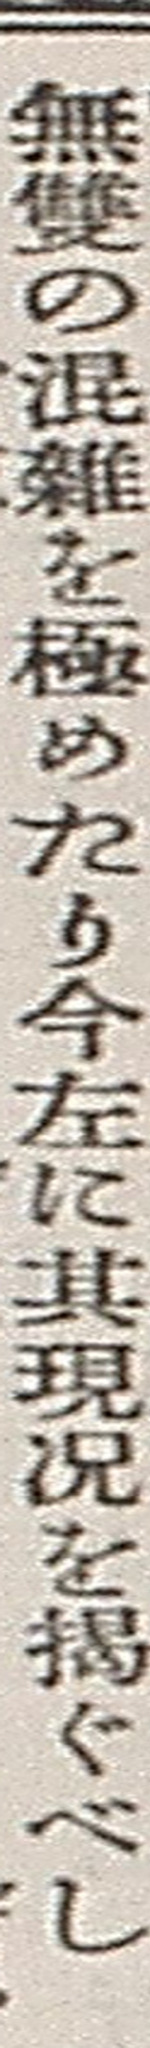無双の混雑を極めたり今左に其現况を掲ぐべし
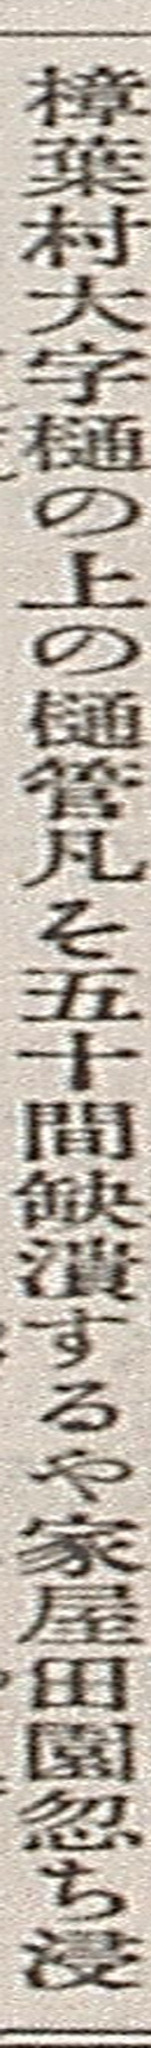樟葉村大字樋の上の樋管凡そ五十間缺潰するや家屋田園忽ち浸
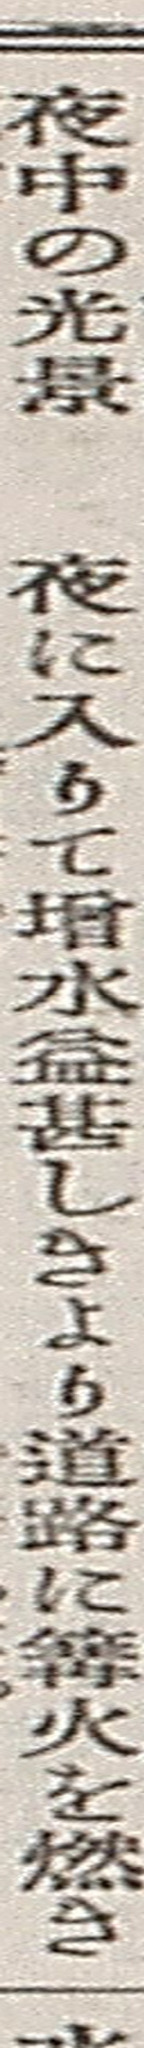夜中の光景夜に入りて増水益甚しきより道路に篝火を燃き
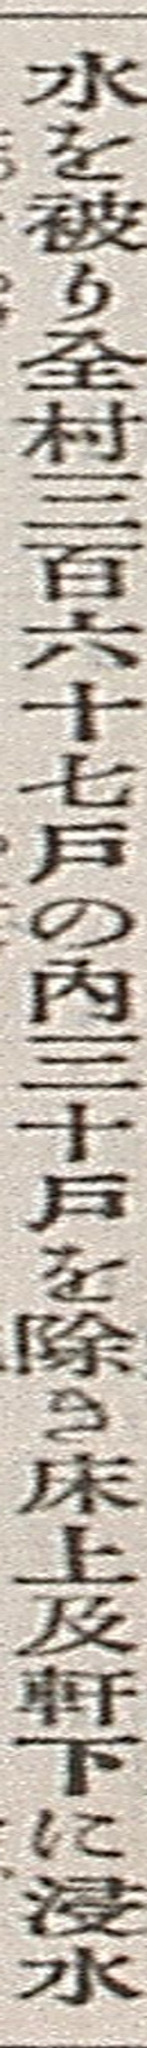水を被り全村三百六十七戸の内三十戸を除き床上及軒下に浸水
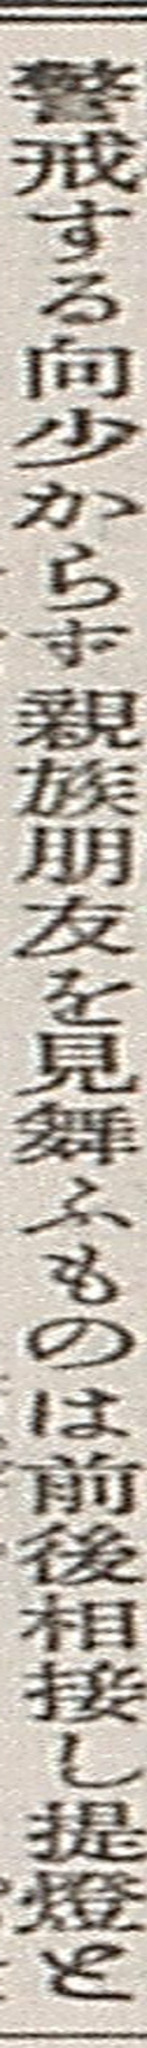警戒する向少からず親族朋友を見舞ふものは前後相接し提燈と
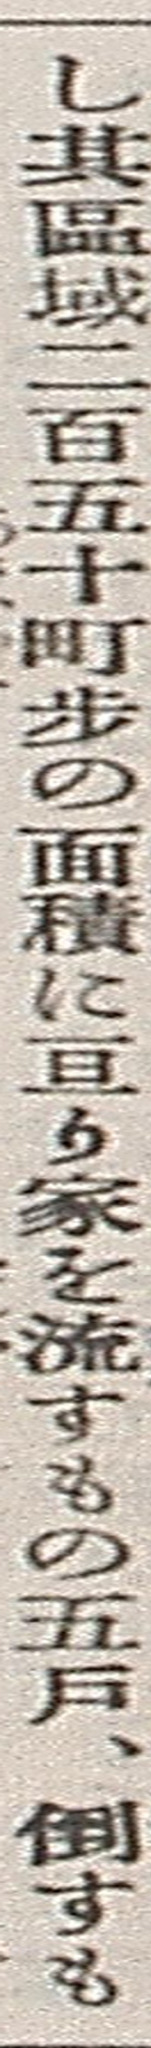し其區域二百五十町歩の面積に亘り家を流すもの五戸、倒すも
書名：風俗畫報臨時増刊第百二十八號　洪水被害録（下）
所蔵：東京大学地震研究所図書室 Earthquake Research Institute Library, The University of Tokyo, JAPAN
